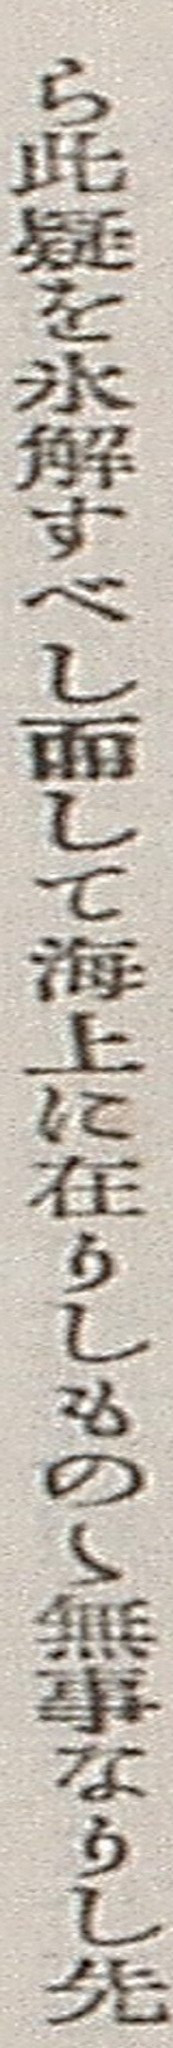ら此疑を氷解すべし而して海上に在りしものゝ無事なりし先
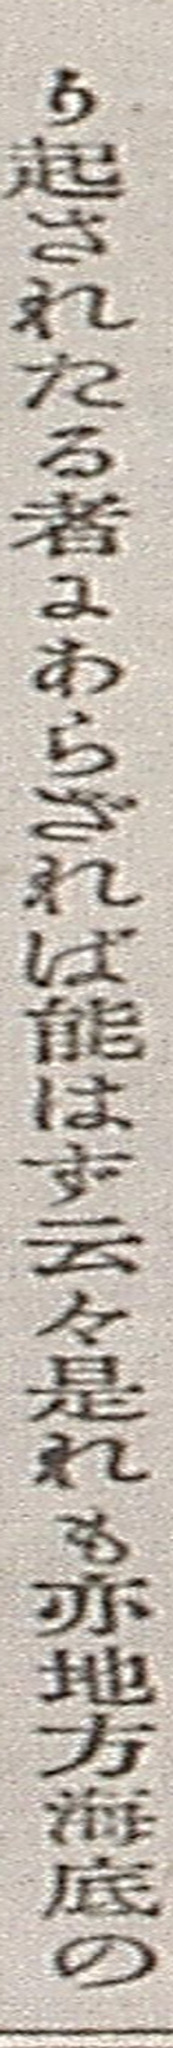り起されたる者にあらざれば能はず云々是れも亦地方海底の
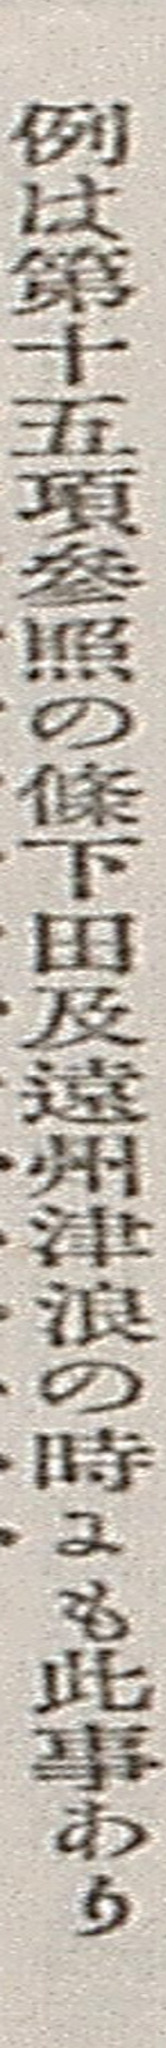例は第十五項参照の条下田及遠州津浪の時にも此事あり
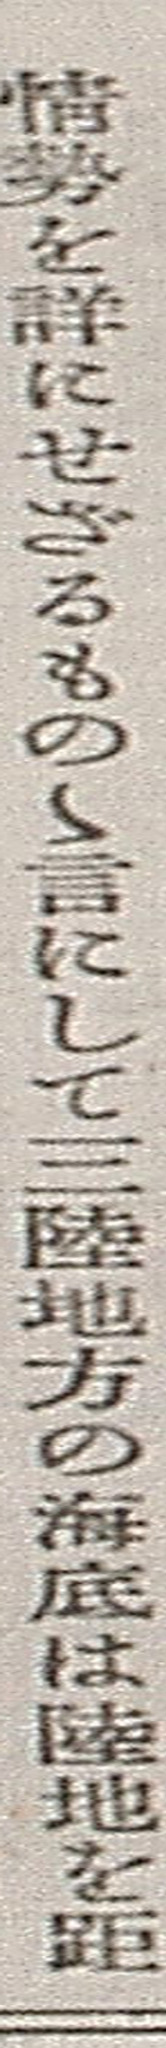情勢を詳にせざるものゝ言にして三陸地方の海底は陸地を距
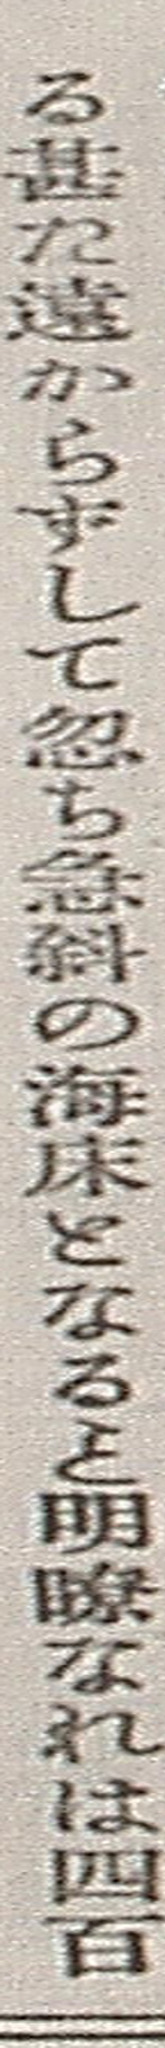る甚た遠からずして忽ち急斜の海床となること明瞭なれは四百
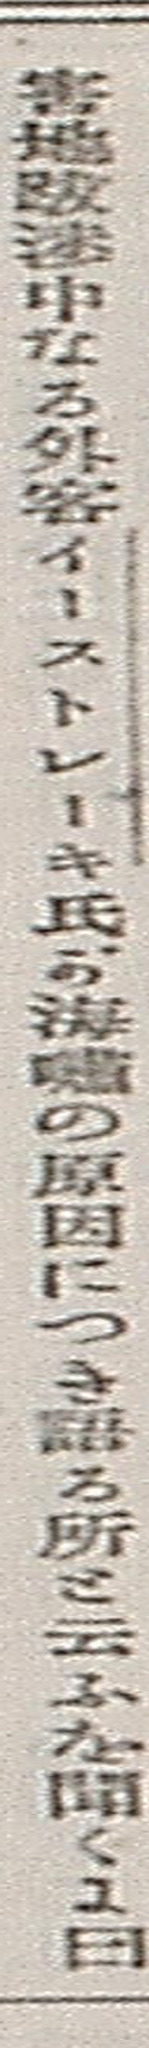害地跋渉中なる外客イーストレーキ氏が海嘯の原因につき語る所と云ふを聞くに曰
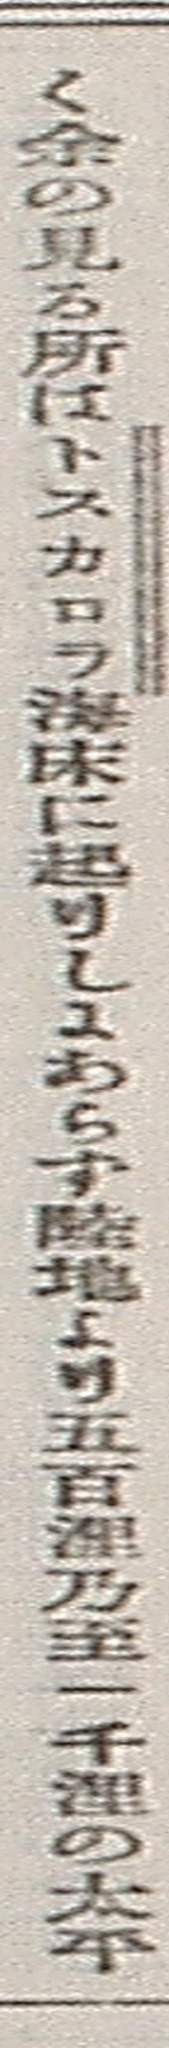く余の見る所はトスカロラ海床に起りしにあらず陸地より五百浬乃至一千浬の太平
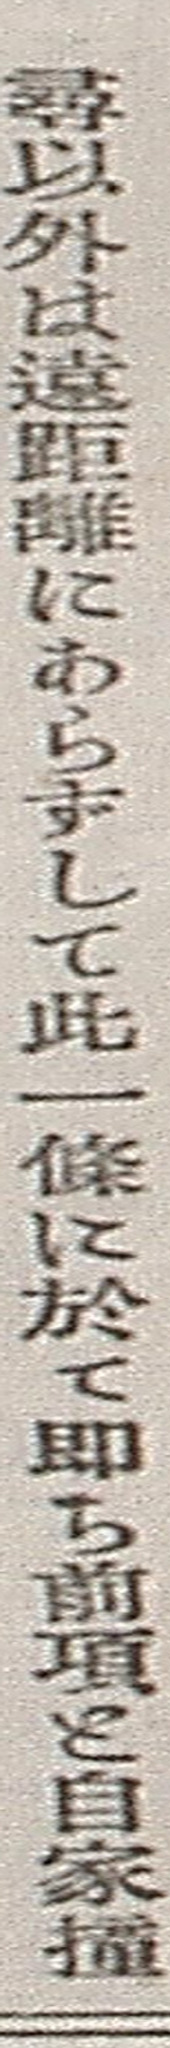尋以外は遠距離にあらずして此一条に於て即ち前項と自家撞
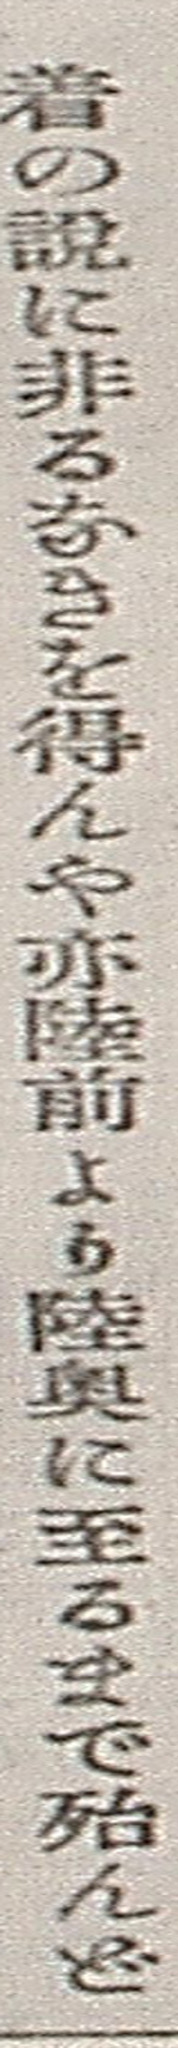着の説に非るなきを得んや亦陸前より陸奥に至るまで殆んど
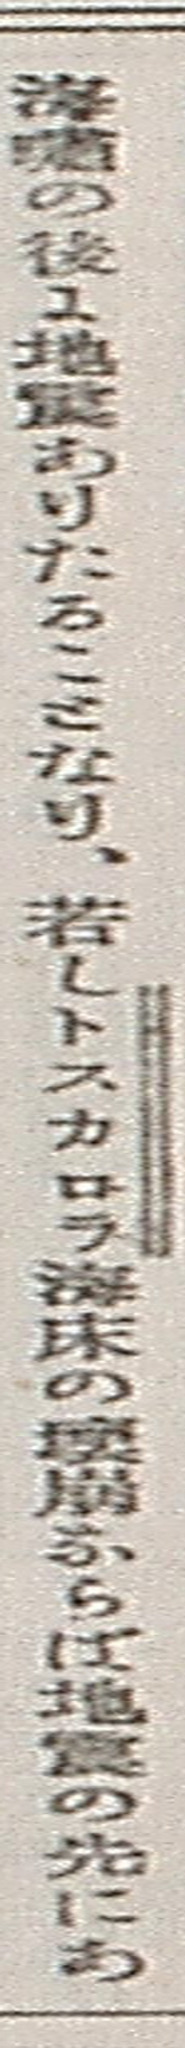海嘯の後に地震ありたることなり、若しトスカロラ海床の壊崩ならば地震の先にあ
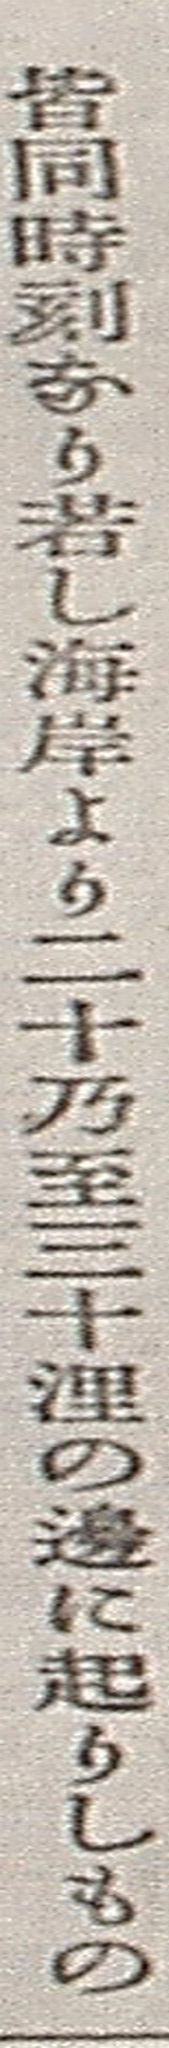皆同時刻なり若し海岸より二十乃至三十浬の辺に起りしもの
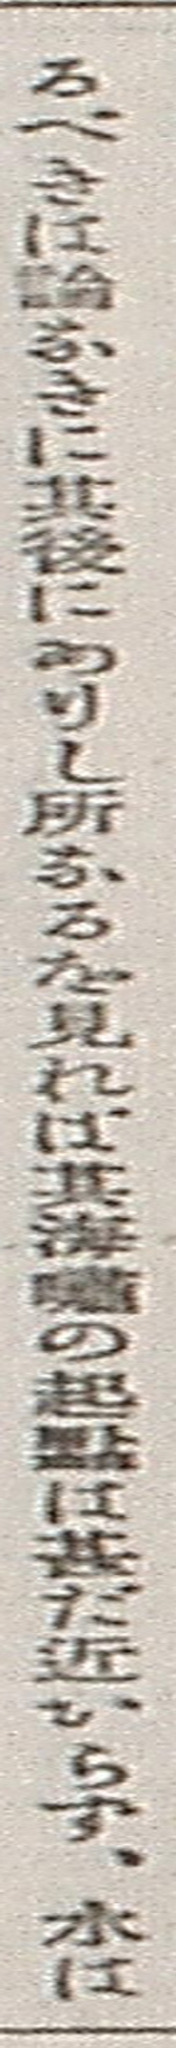るべきは論なきに其後にありし所なるを見れば其海嘯の起点は甚だ近からず、水は
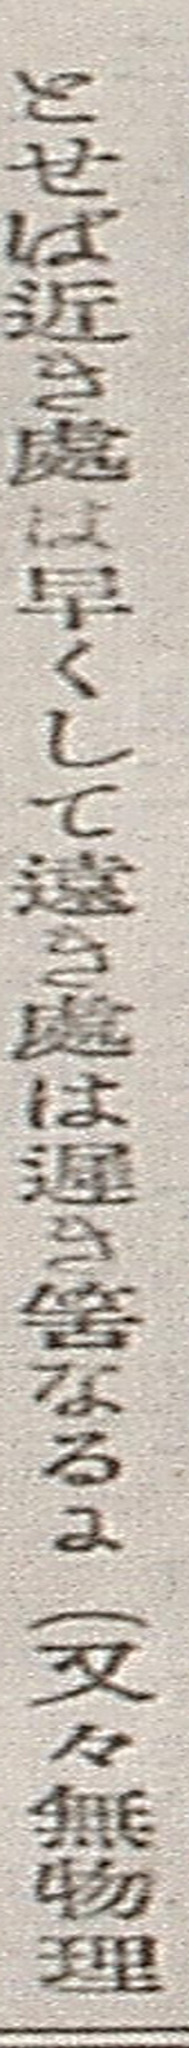とせば近き処は早くして遠き処は遅き筈なるに（又々無物理
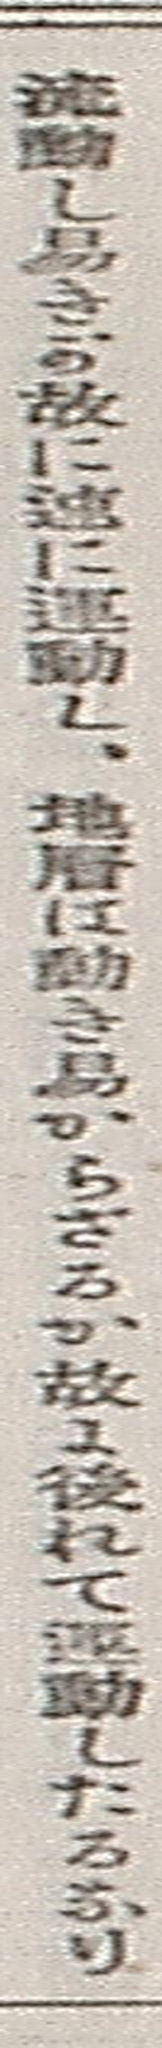流動し易きが故に速に運動し、地層は動き易からざるか故に後れて運動したるなり
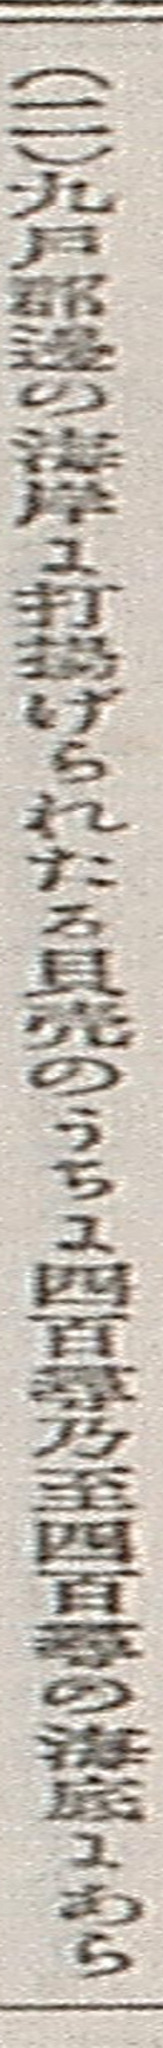九戸郡辺の海岸に打揚げられたる貝売のうちに四百尋乃至四百尋の海底にあら
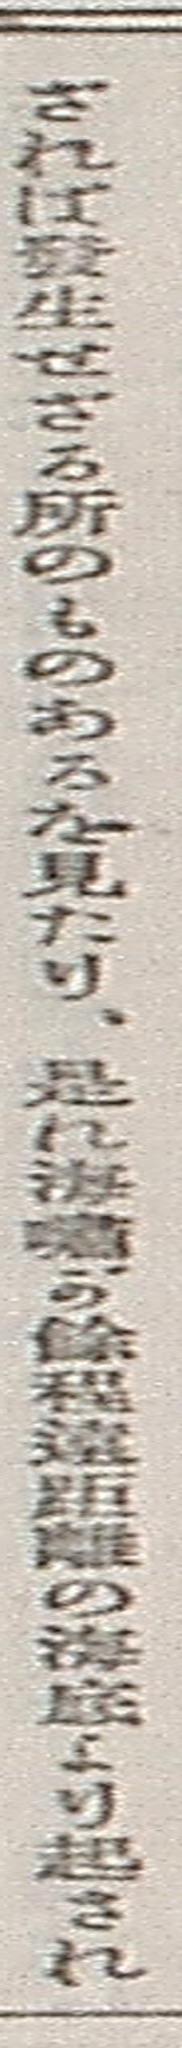ざれば発生せざる所のものあるを見たり、是れ海嘯が余程遠距離の海底より起され
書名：風俗畫報臨時増刊第百十九號　大海嘯被害録（中）
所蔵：東京大学地震研究所図書室 Earthquake Research Institute Library, The University of Tokyo, JAPAN
